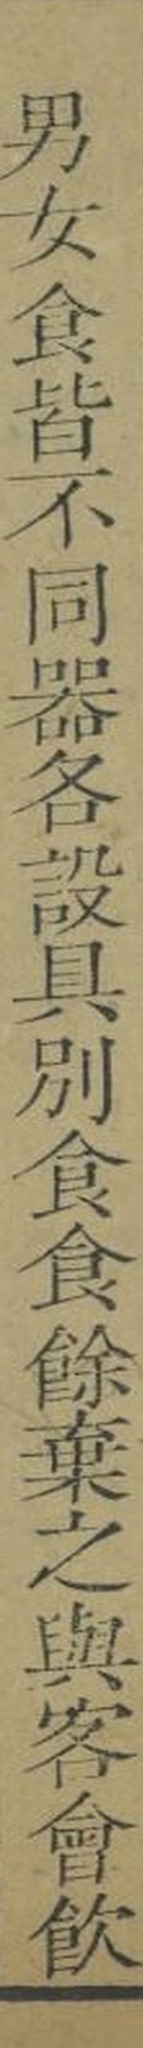男女食皆不同器各設具別食食余棄之与客会飲
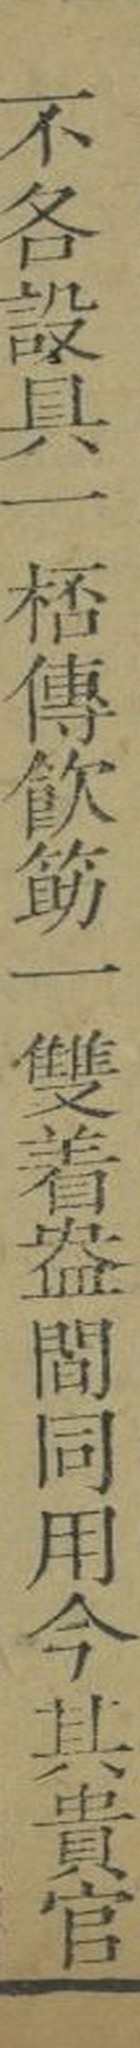不各設具一杯伝飲筯一双着盎間同用今其貴官
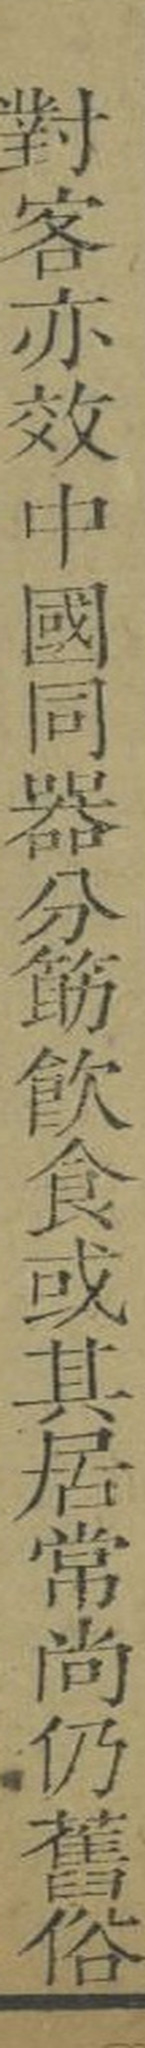対客亦效中国同器分筯飲食或其居常尚仍旧俗
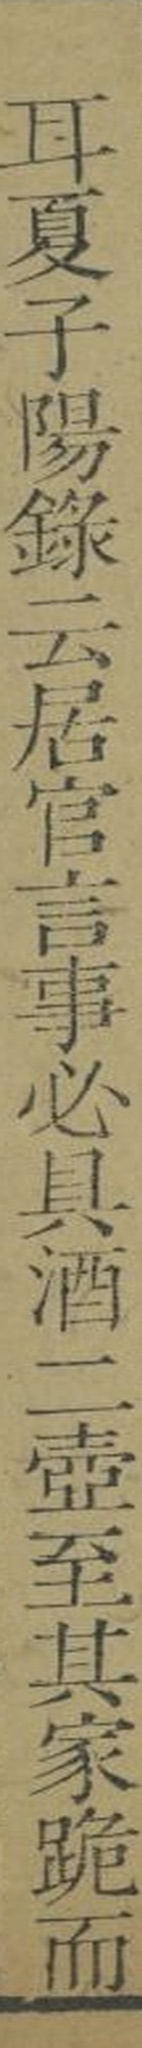耳夏子陽録云居官言事必具酒二壺至其家跪而
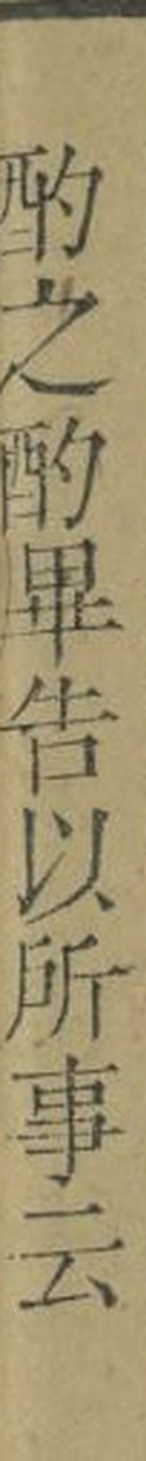酌之酌畢告以所事云
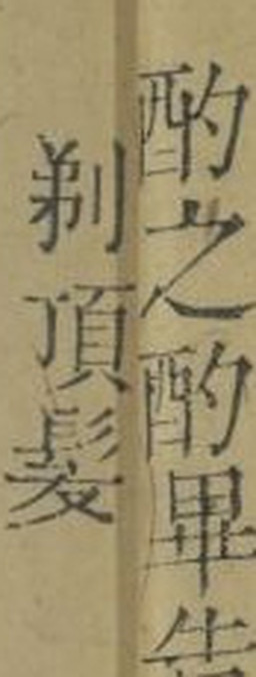剃頂髪
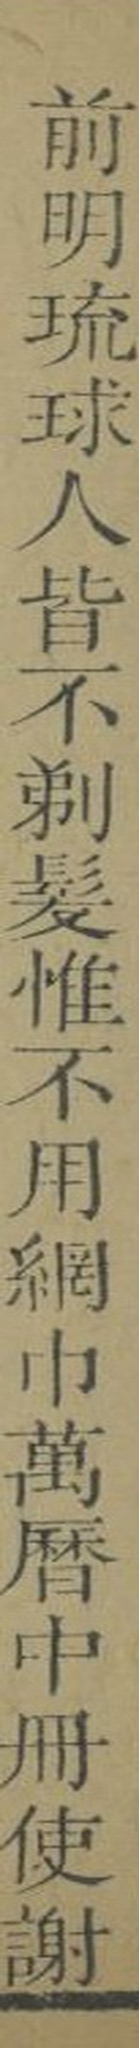前明琉球人皆不剃髪惟不用網巾万暦中冊使謝
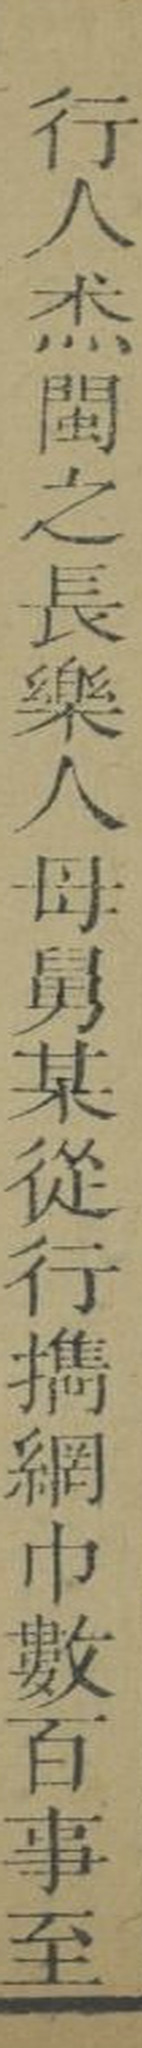行人杰閩之長楽人母舅某従行携網巾数百事至
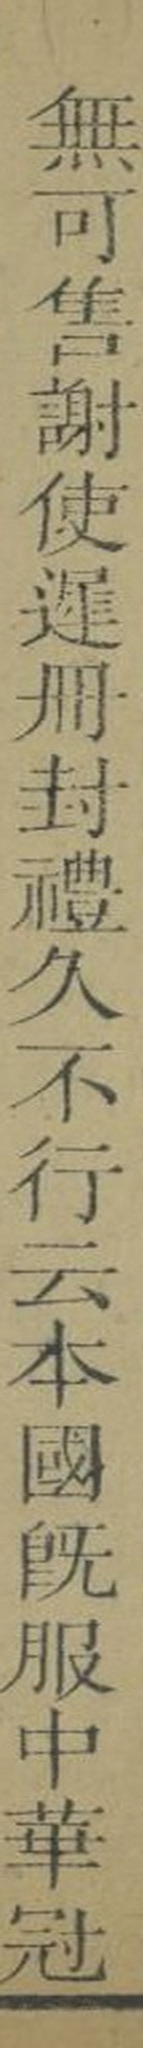無可售謝使遅冊封礼久不行云本国既服中華冠
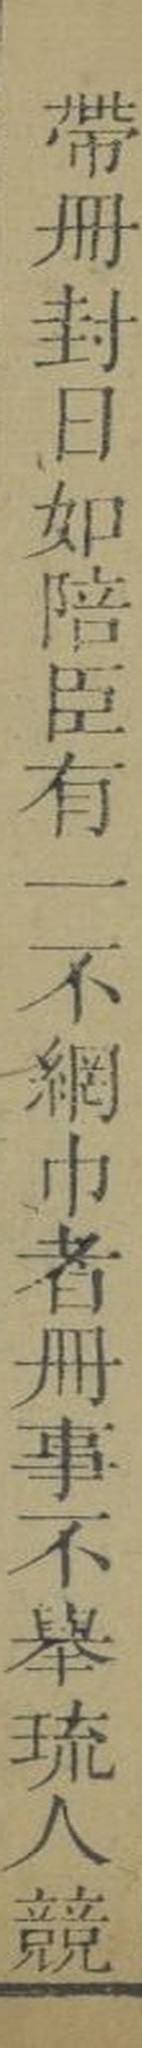帯冊封曰如陪臣有一不網巾者冊事不挙琉人競
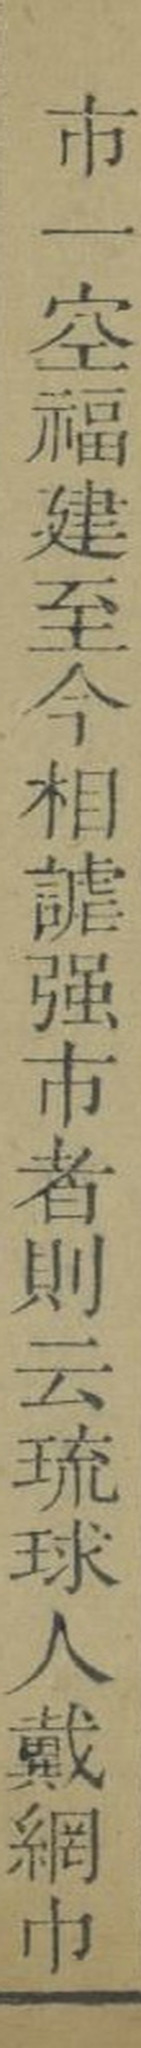市一空福建至今相謔強市者則云琉球人戴網巾
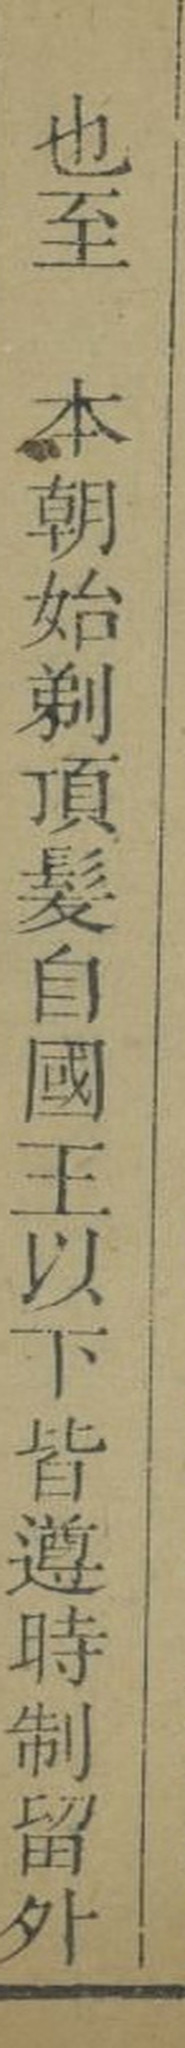也至本朝始剃頂髪自国王以下皆遵時制留外
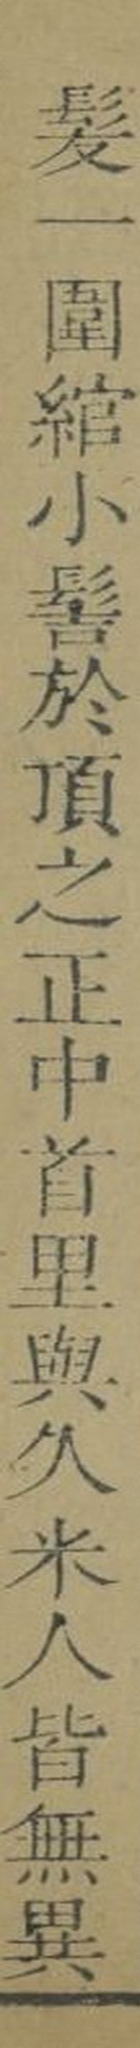髪一囲綰小髻於頂之正中首里与久米人皆無異
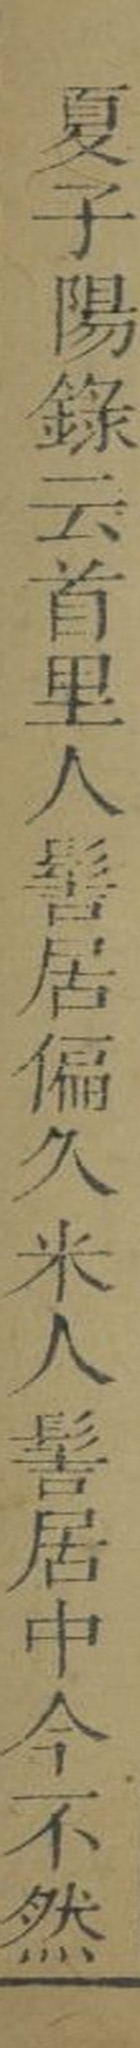夏子陽録云首里人髻居偏久米人髻居中今不然

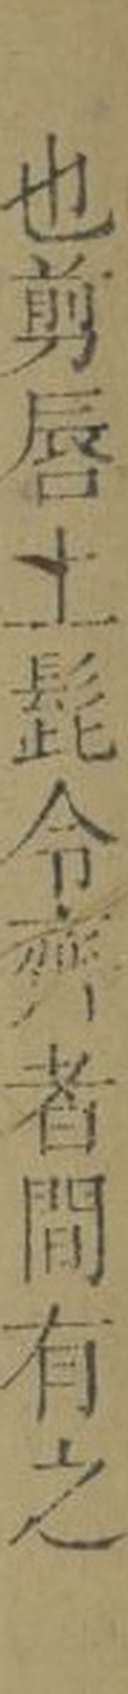也剪唇上髭令斉者間有之
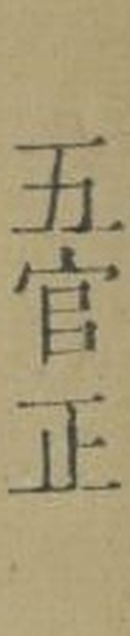五官正
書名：中山伝信録 巻六
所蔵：University of the Ryukyus Library
